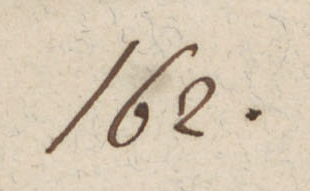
162.
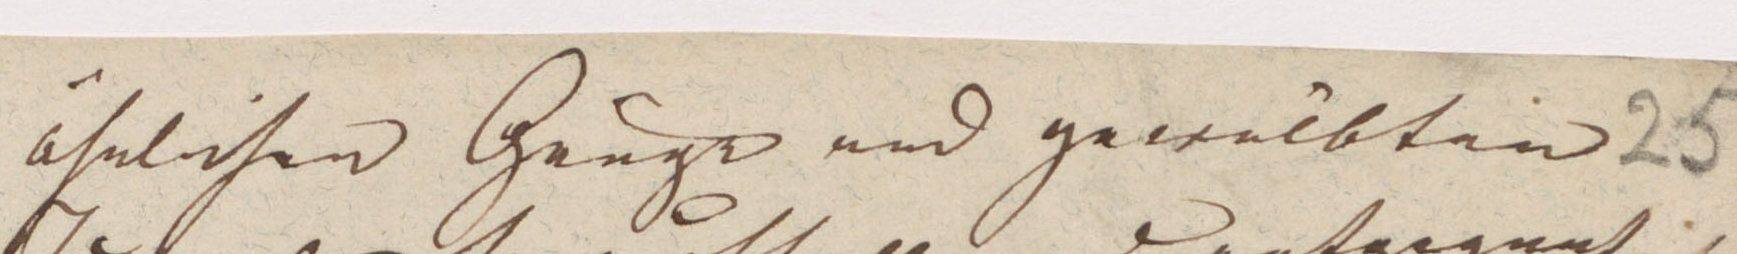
ähnlichen Gänge und gewölbten
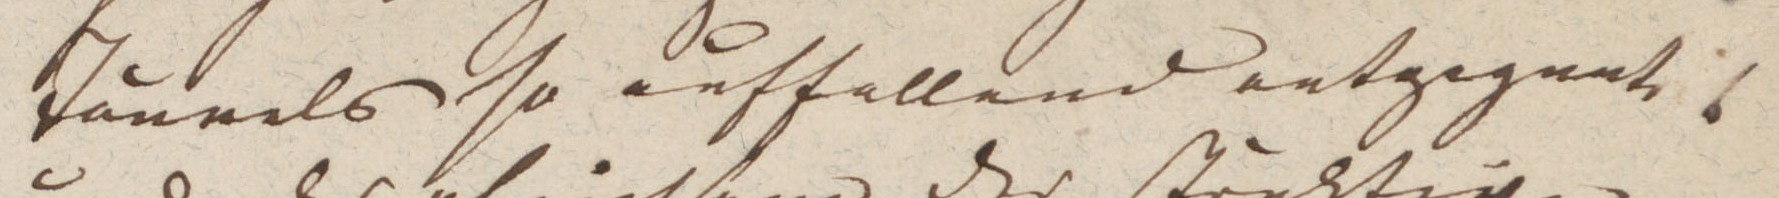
Tunnels so auffallend entgegnet
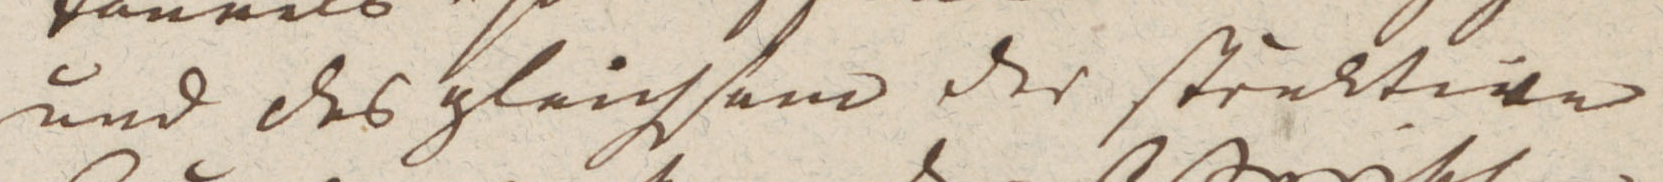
und das gleichsam der struktive
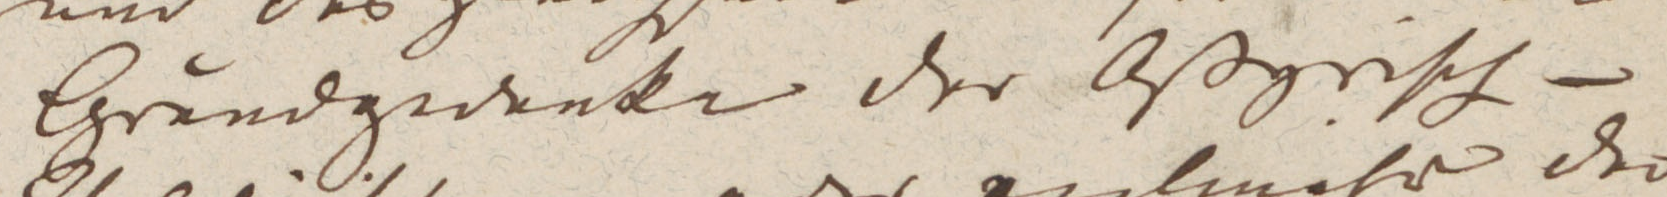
Grundgedanke der Assyrisch-
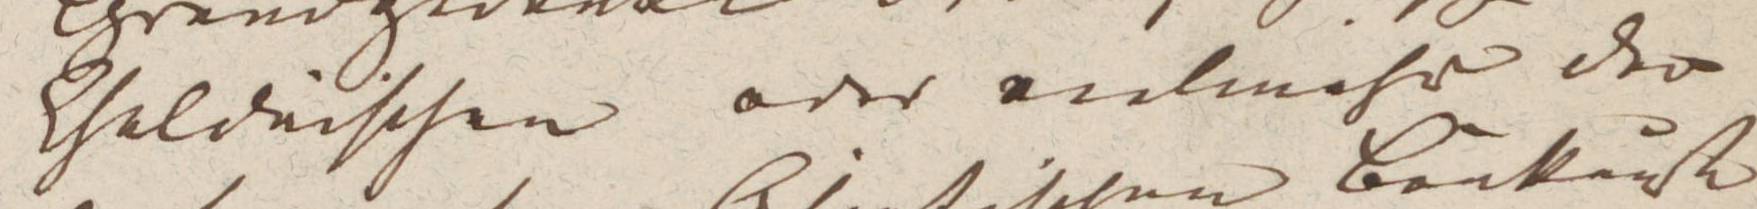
Chaldäischen oder vielmehr der
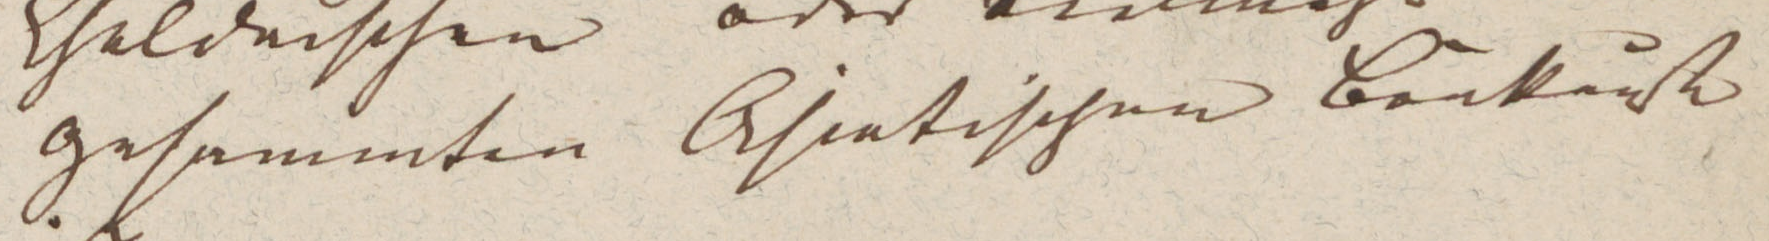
gesammten Asiatischen Baukunst
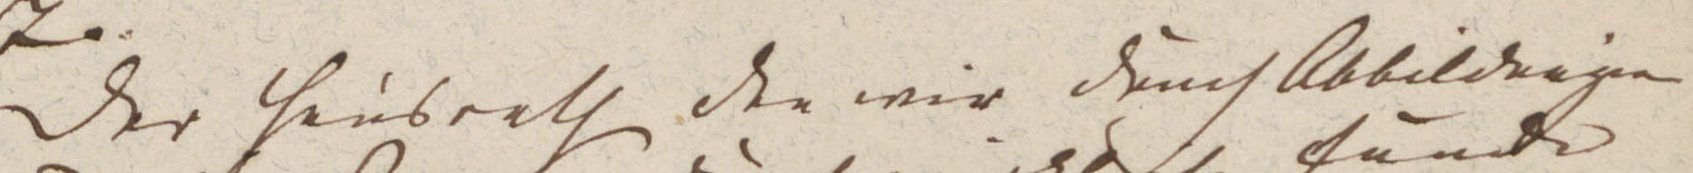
Der Hausrath den wir durch Abbildungen
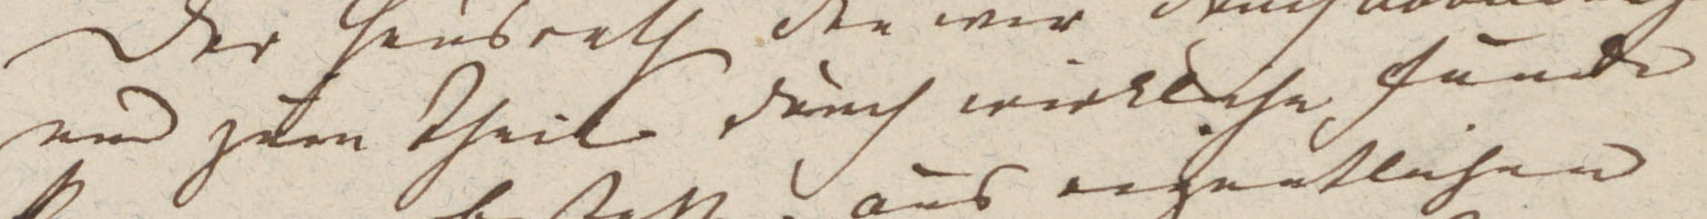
und zum Theil durch wirkliche Funde
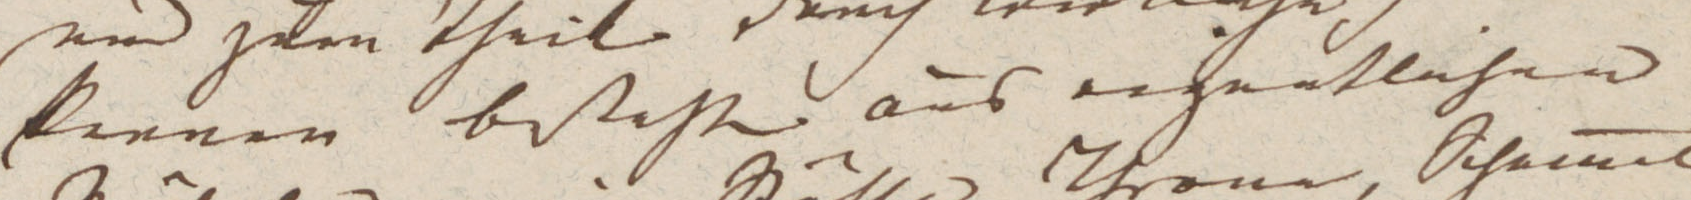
kennen besteht aus eigentlichen
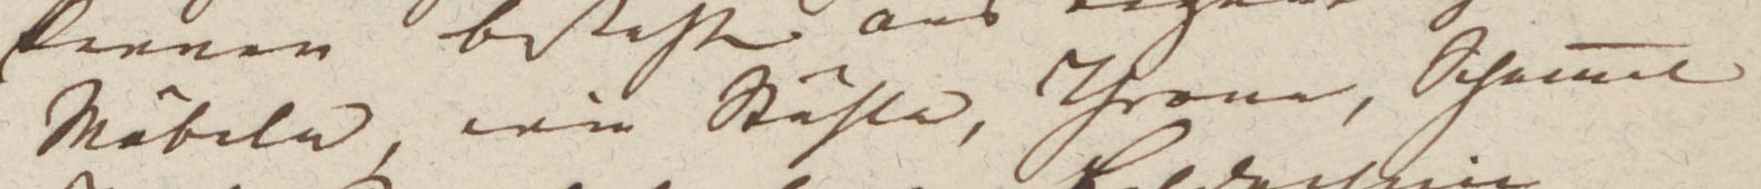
Möbeln, wie Stühle, Throne, Schemmel
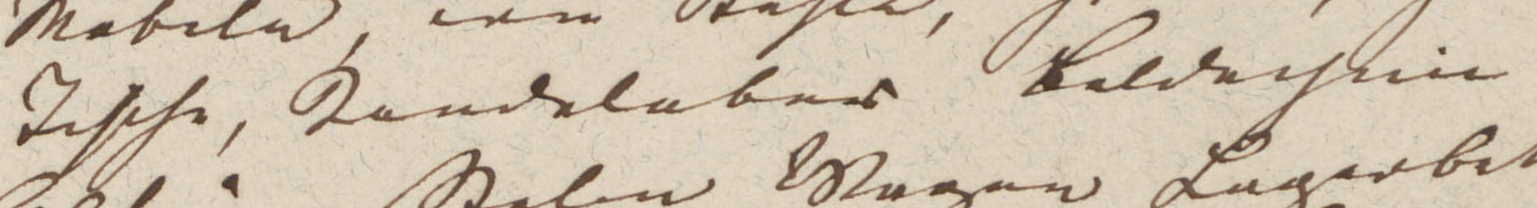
Tische, Kandelaber Baldachine
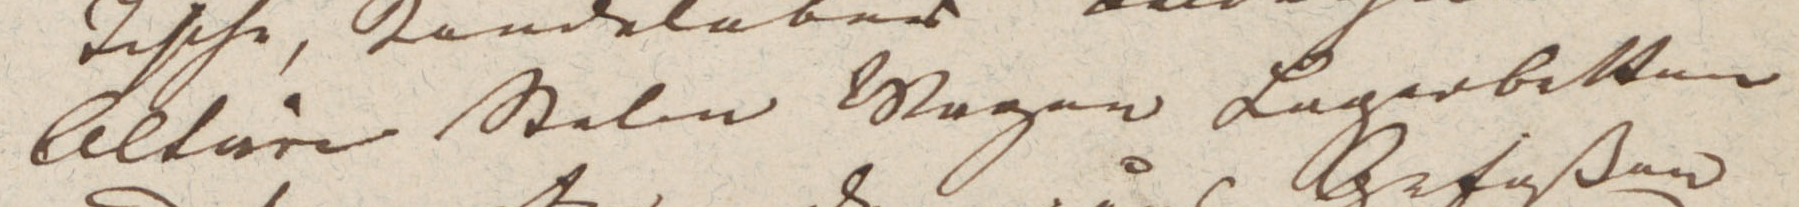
Altäre Stelen Wagen Lagerbetten
